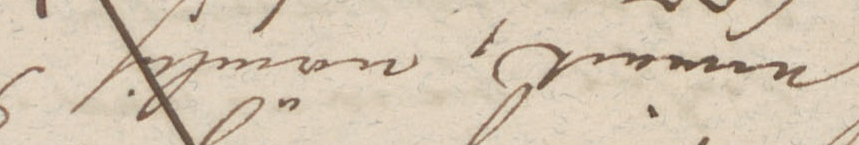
in seiner ganzen
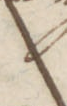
den
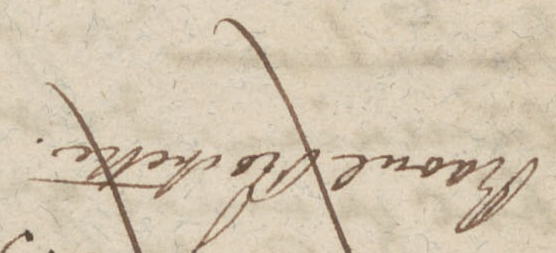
Derselbe Gebrauch
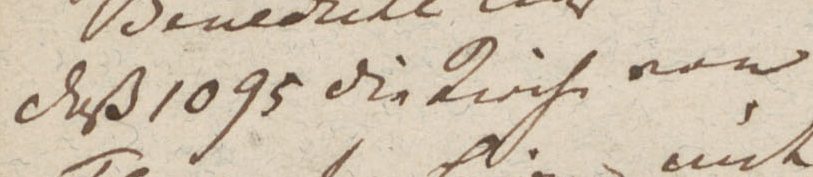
dass 1095 die Kirche von
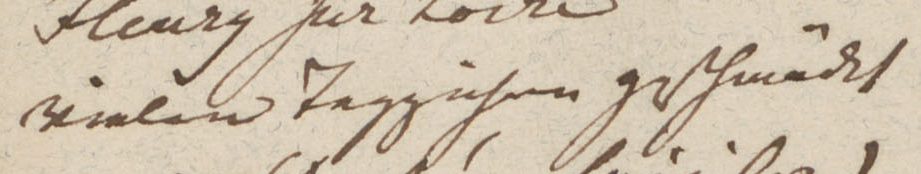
vielen Tapeten geschmückt
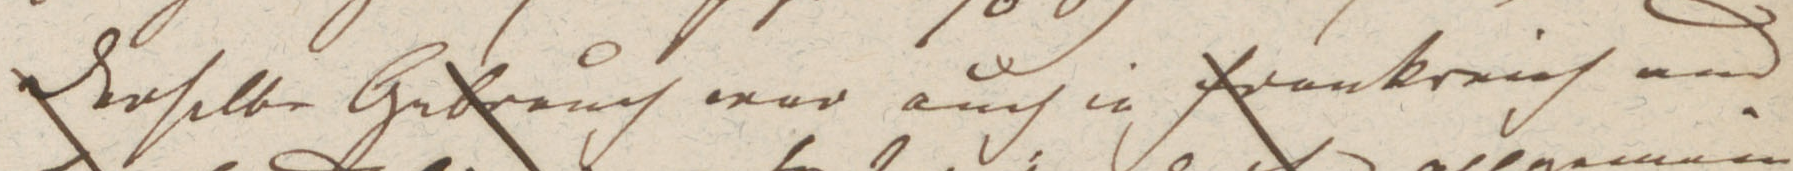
Derselbe Gebrauch war auch in Frankreich % und
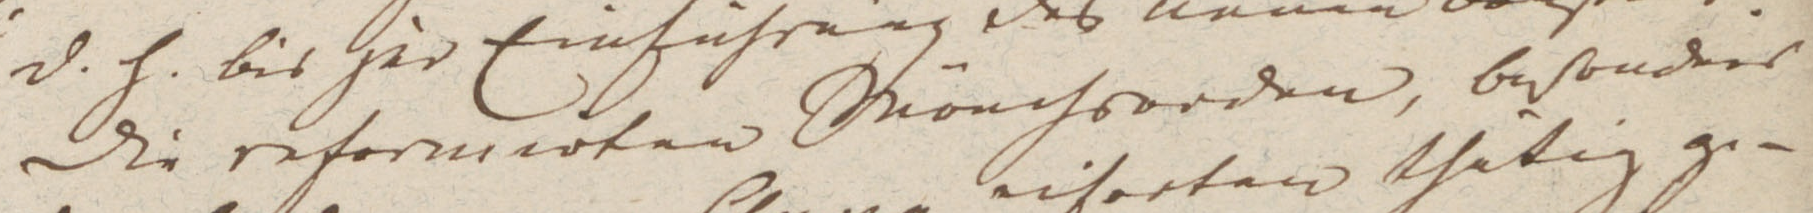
Die reformirten Mönchsorden, besonders
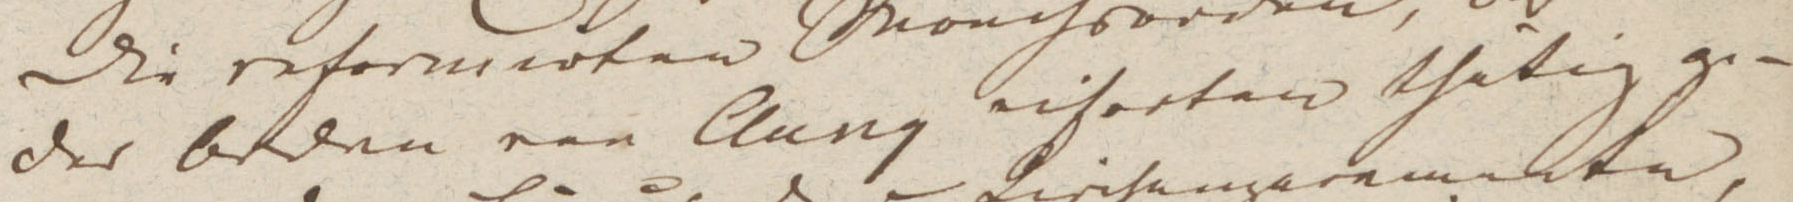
der Orden von Cluny eiferten thätig ge-
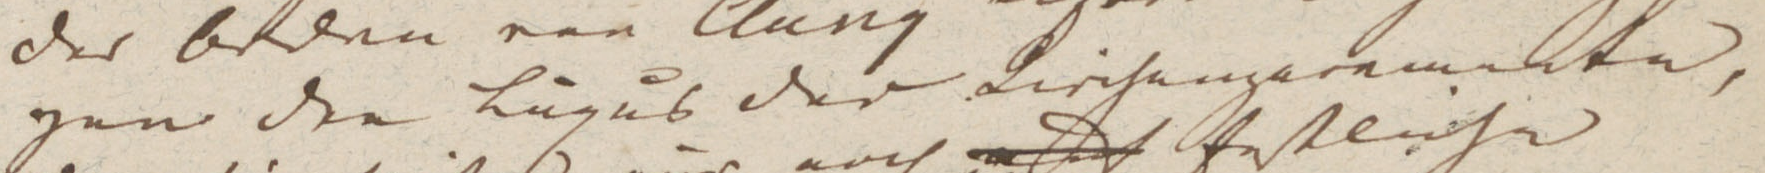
gen den Luxus der Kirchenparamente,
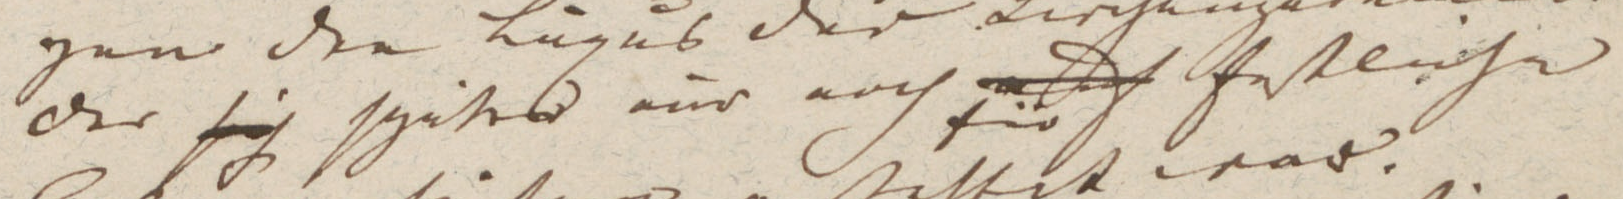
der sich später nur noch für festliche
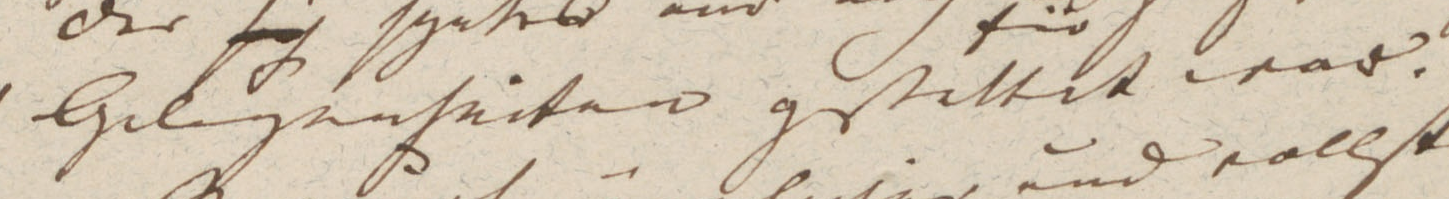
Gelegenheiten gestattet war.
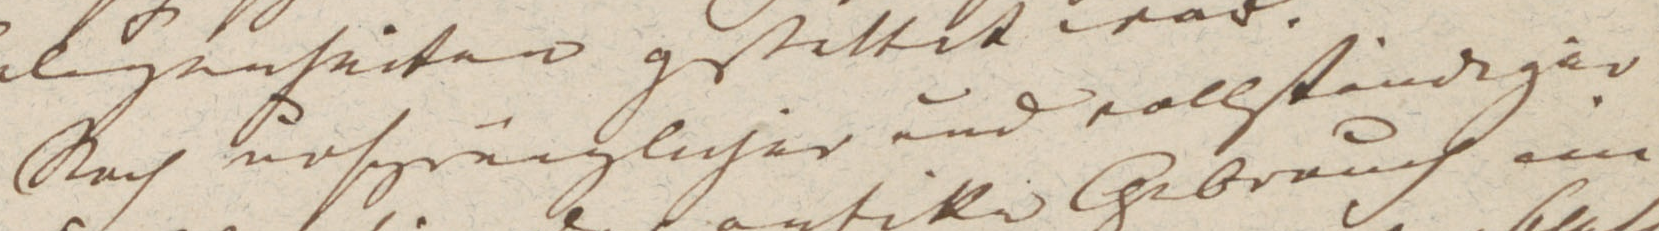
Noch ursprünglicher und vollständiger
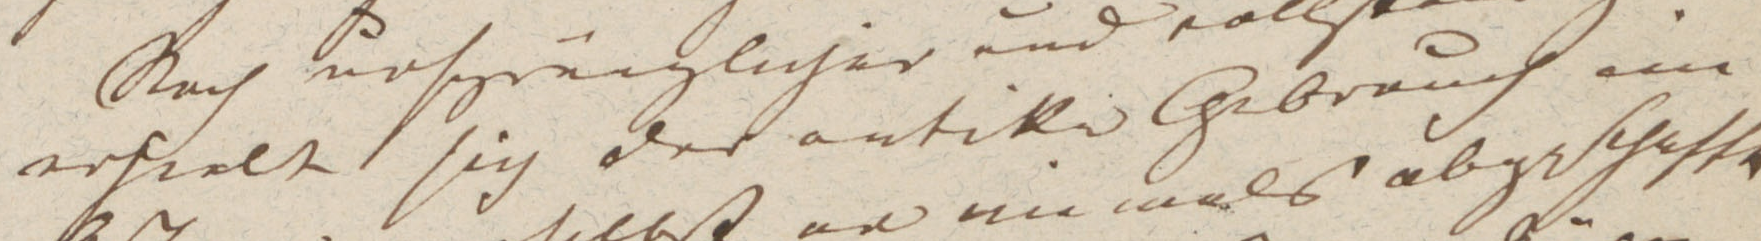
erhielt sich der antike Gebrauch im
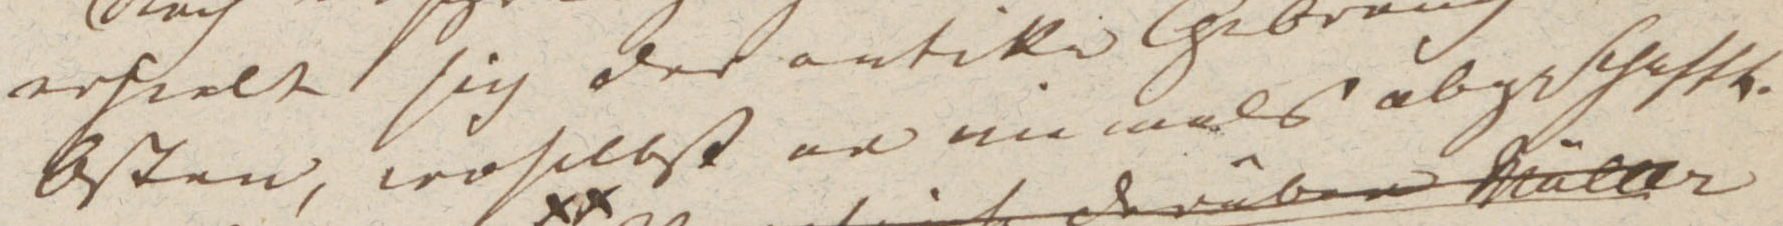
Osten, woselbst er niemals abgeschafft
